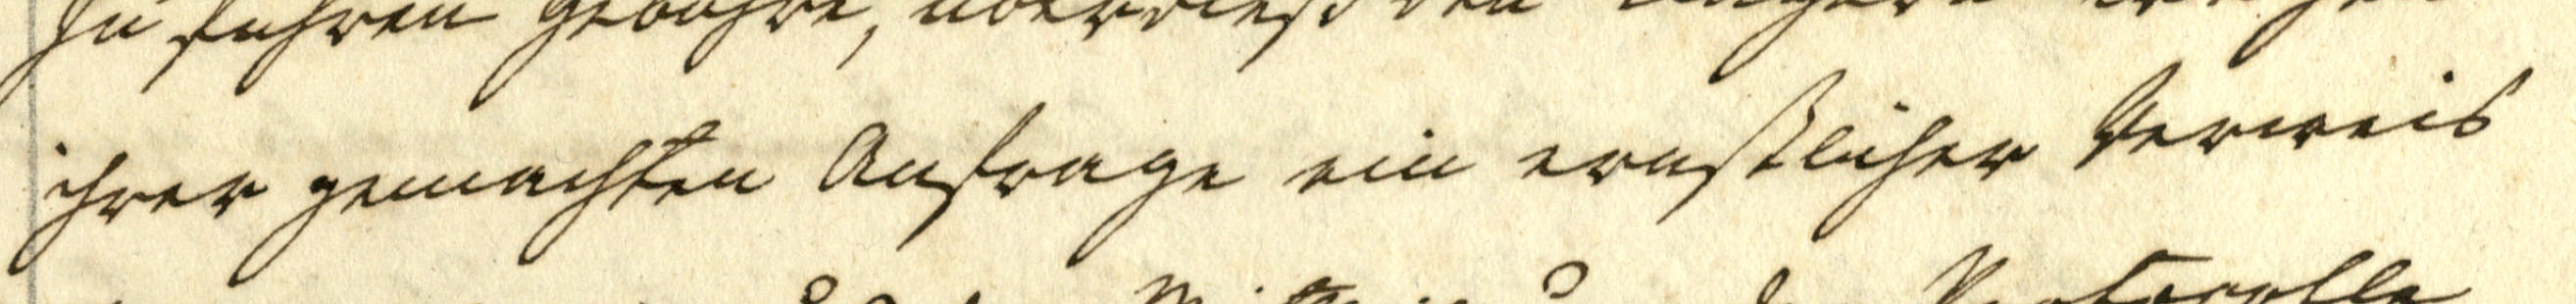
ihrer gemachten Anfrage ein ernstlicher Verweis
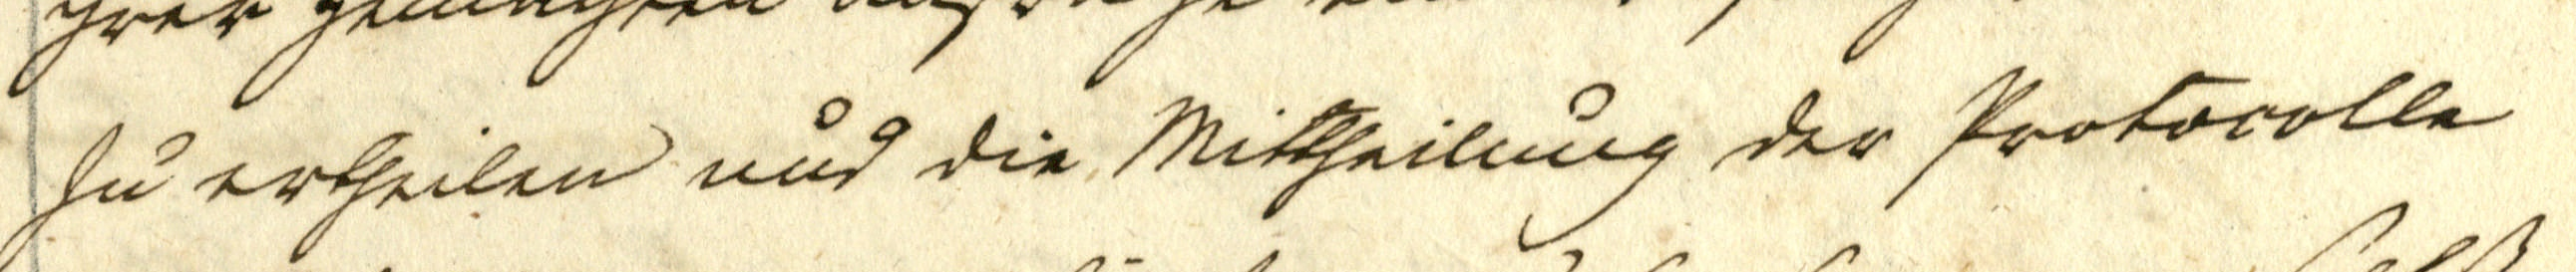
zu ertheilen und die Mittheilung der Protocolle
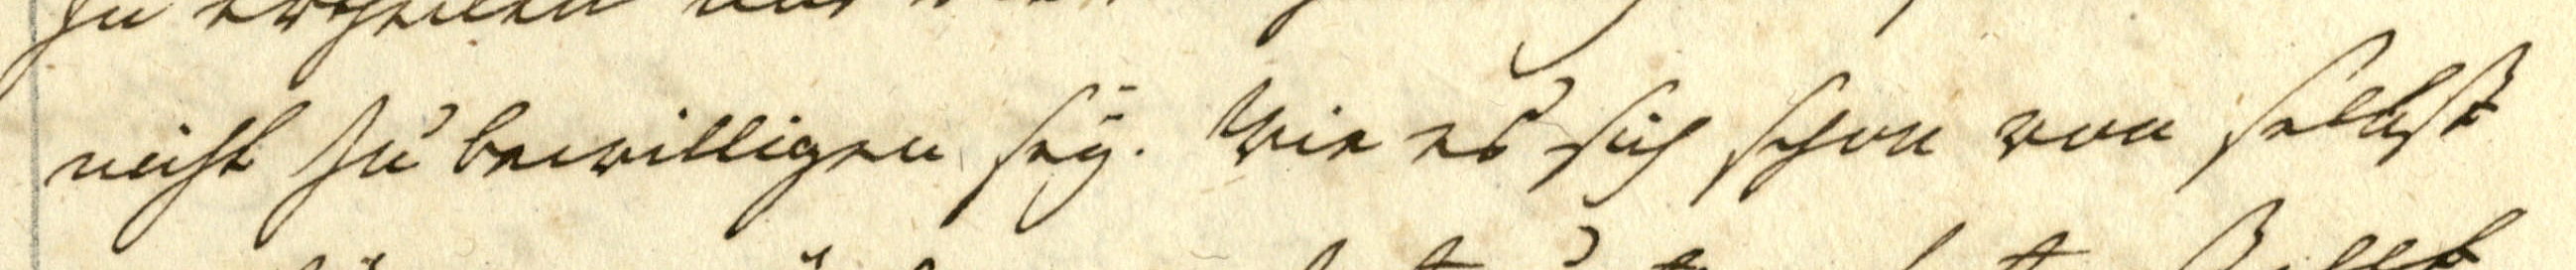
nicht zu bewilligen seÿ. Wie es sich schon von selbst
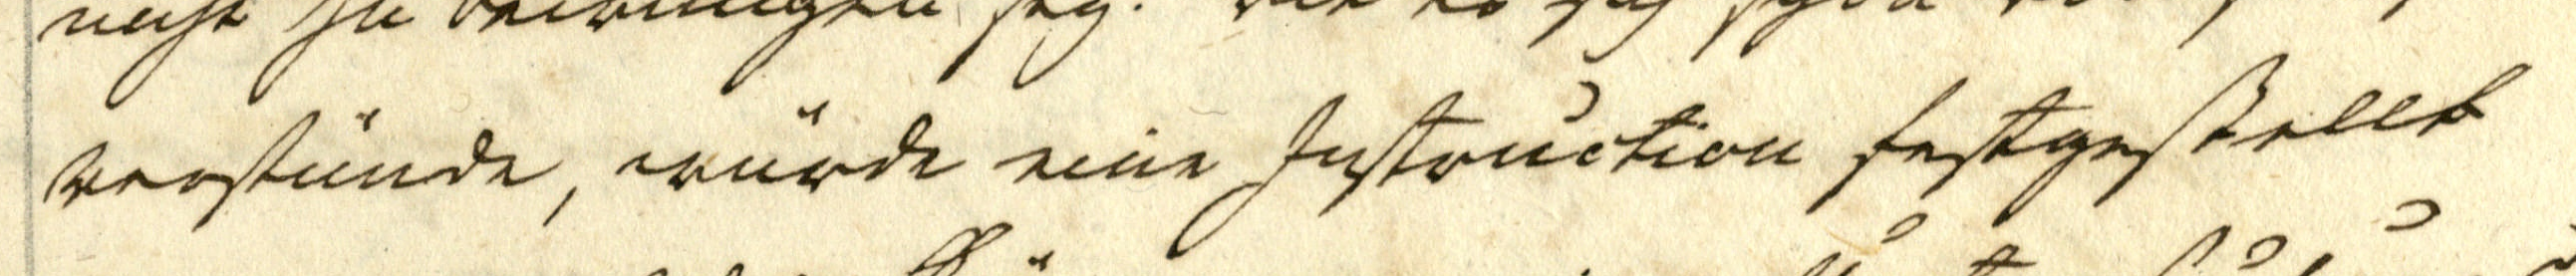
verstünde, würde eine Instruction festgestellt
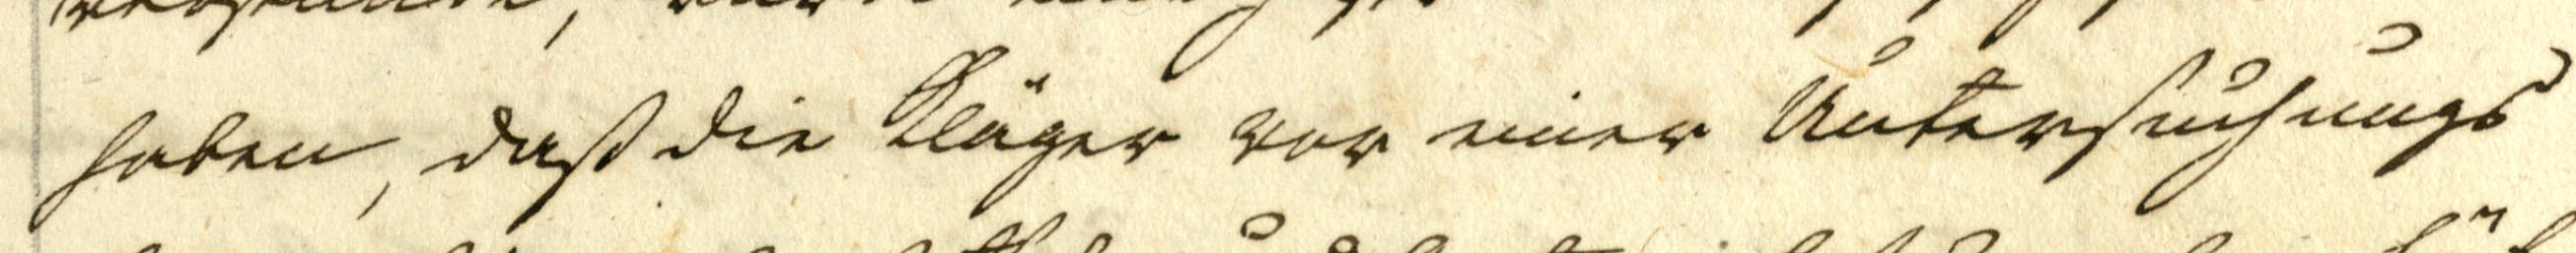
haben, daß die Kläger vor einer Untersuchungs
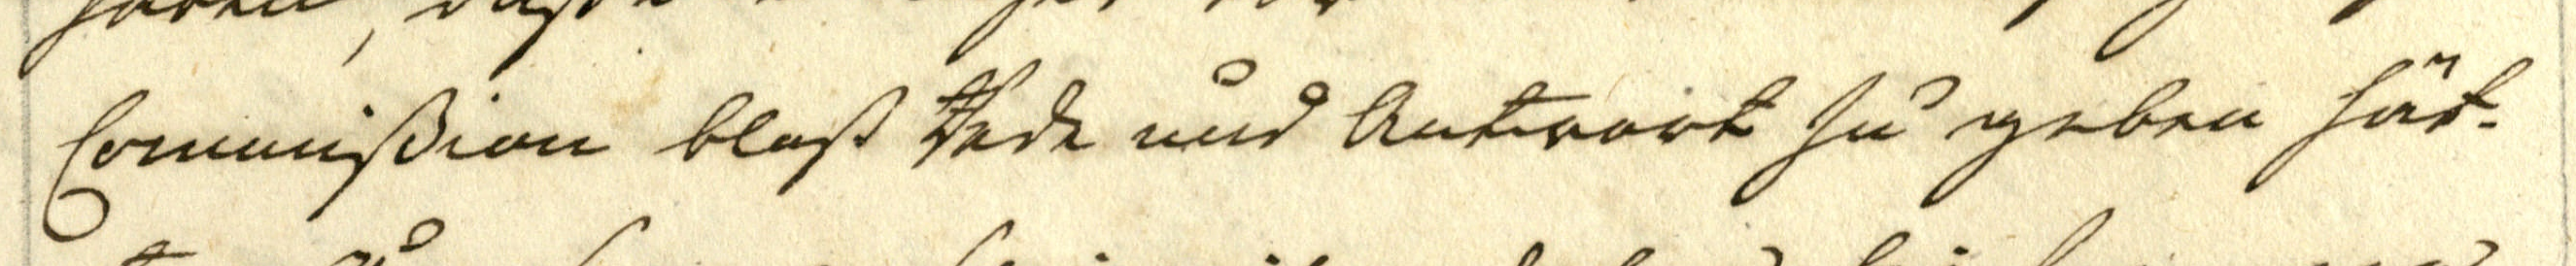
Commission bloß Rede und Antwort zu geben hät¬
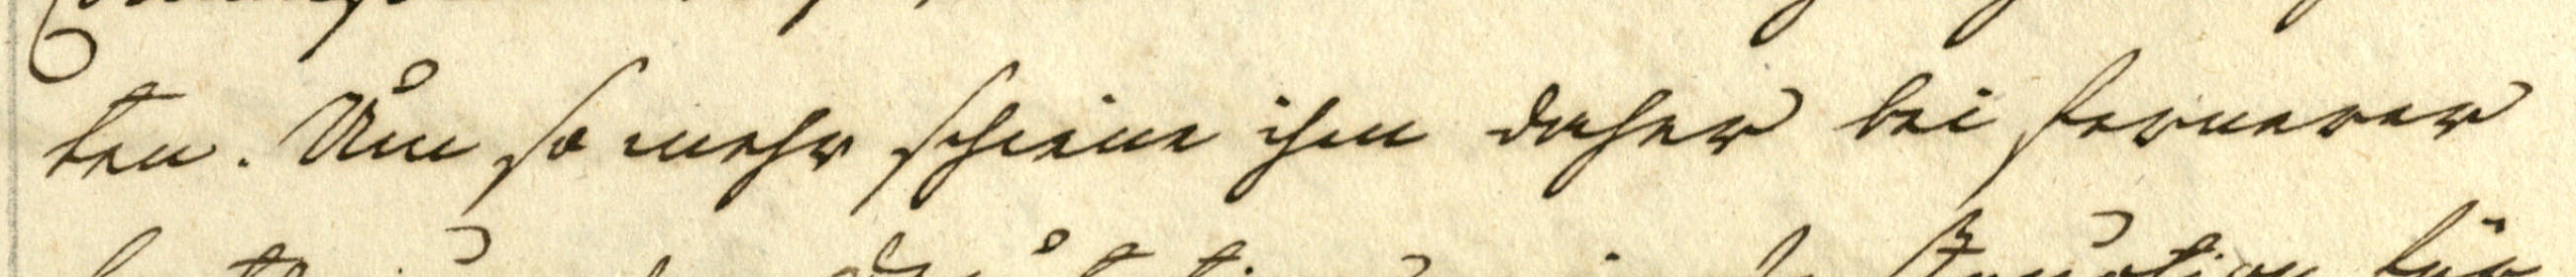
ten. Um so mehr schiene ihm daher bei fernerer
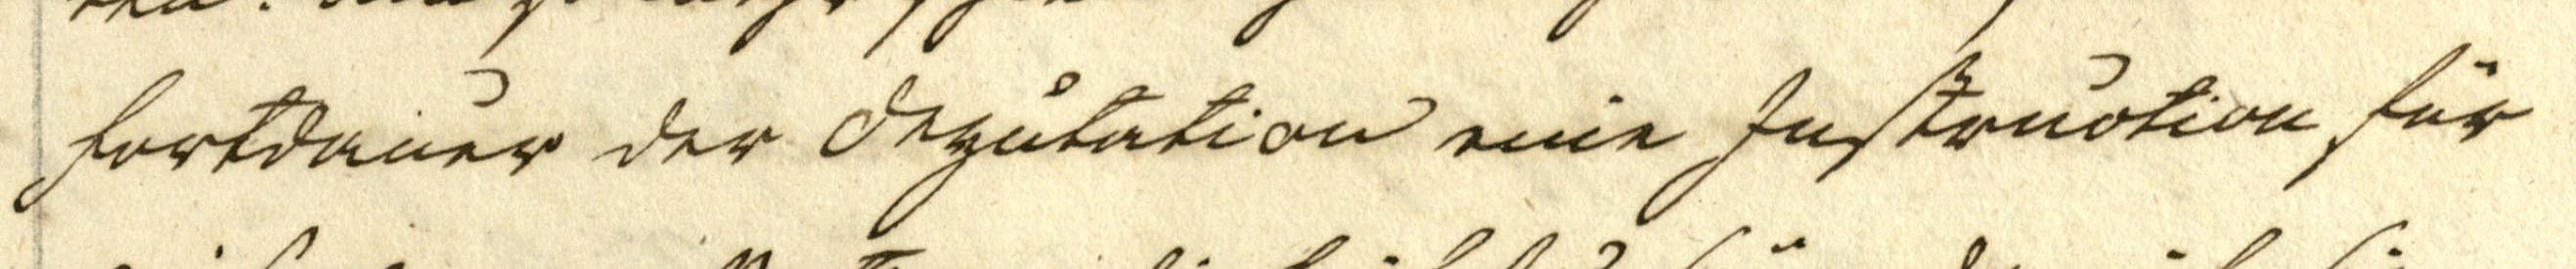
Fortdauer der Deputation eine Instruction für
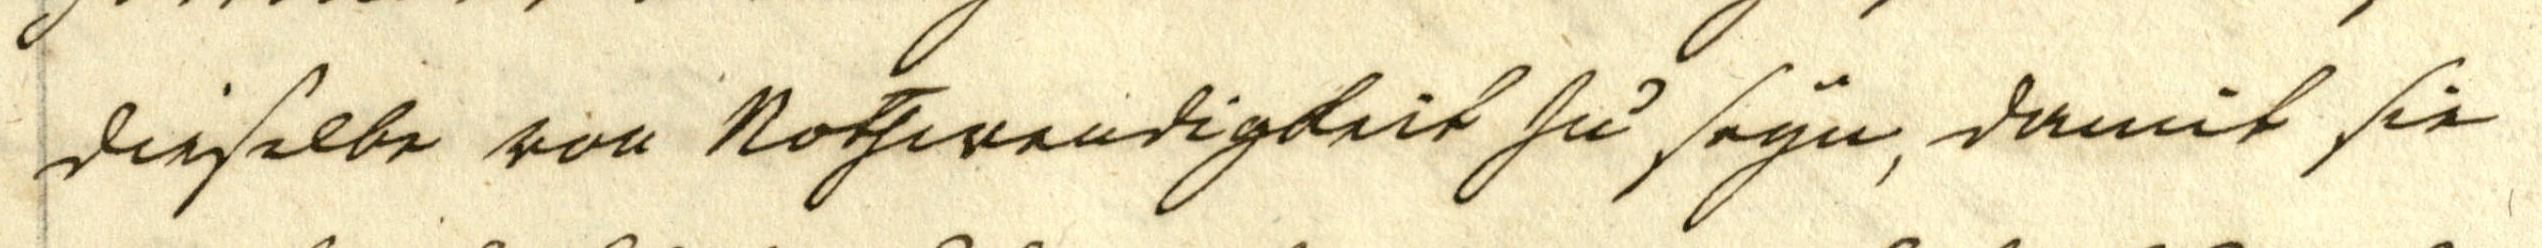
dieselbe von Nothwendigkeit zu seÿn, damit sie
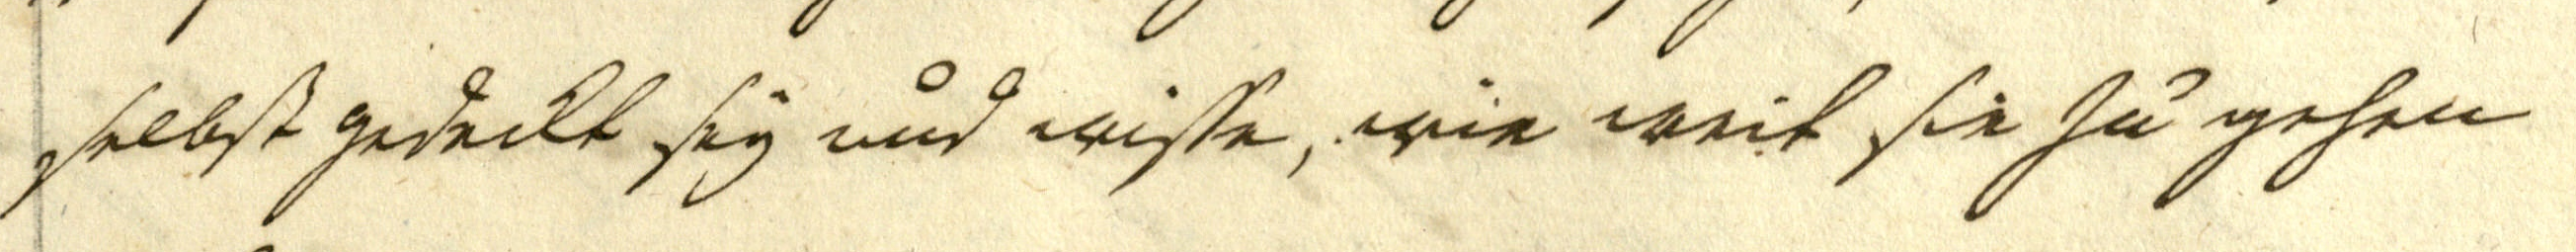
selbst gedeckt seÿ und wisse, wie weit sie zu gehen
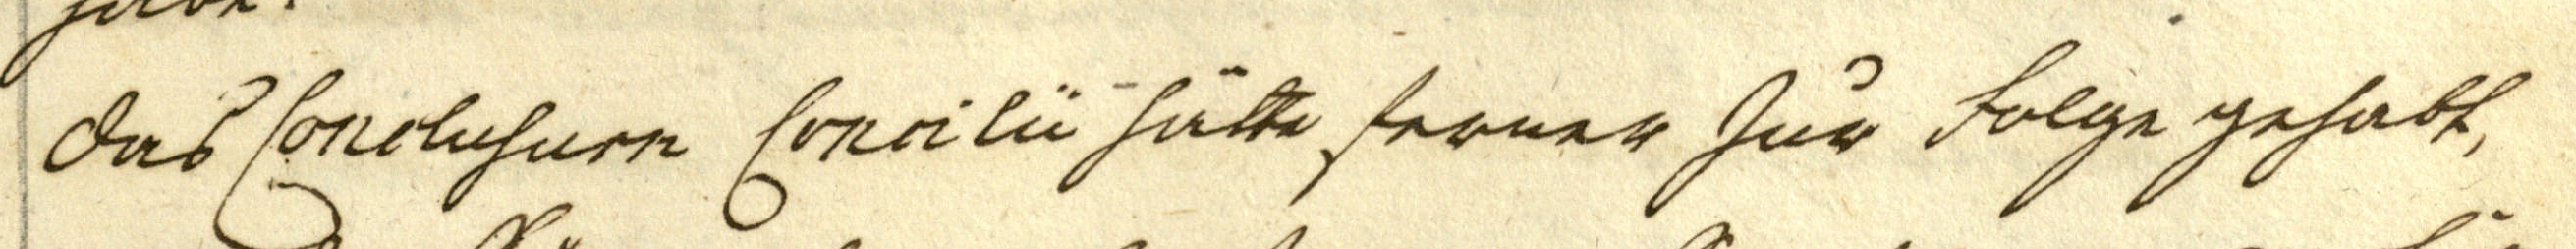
Das Conclusum Concilii hätte ferner zur Folge gehabt,
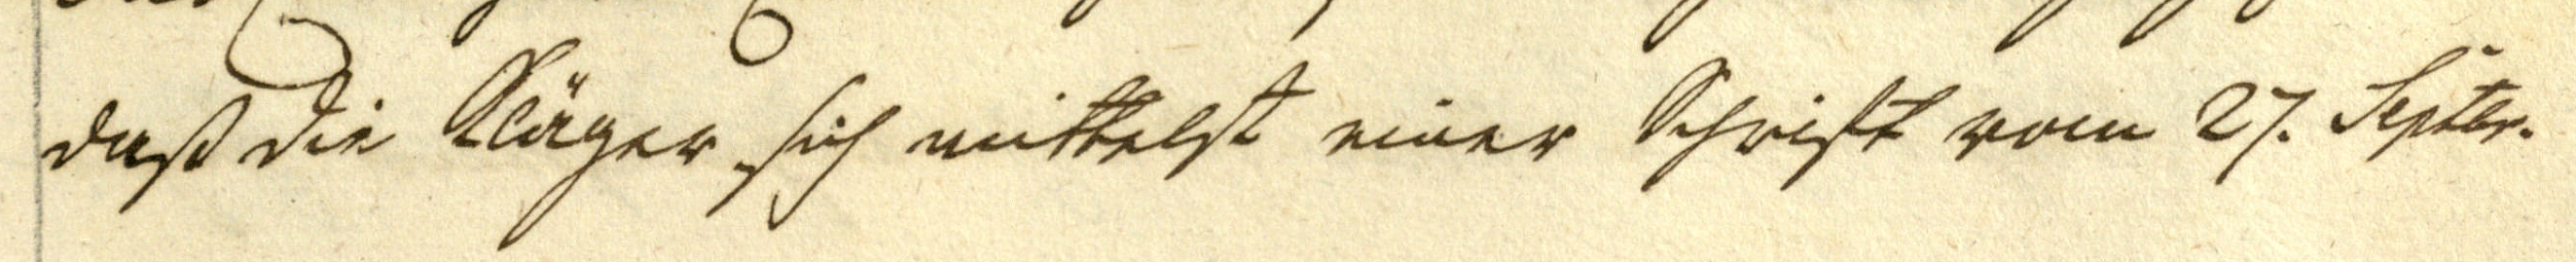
daß die Kläger sich mittelst einer Schrift vom 27. Septbr.
